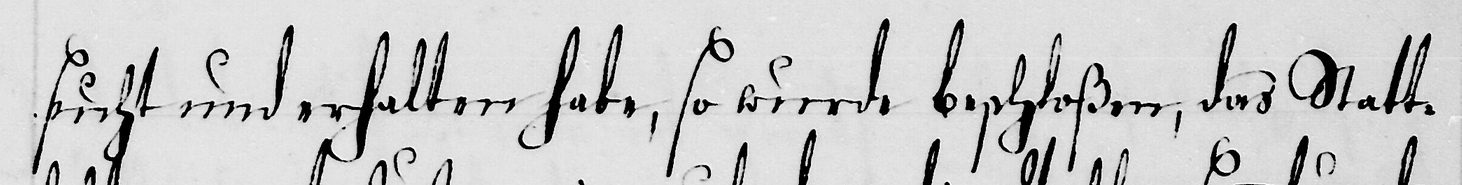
sucht und erhalten habe, so wurde beschloßen, das Statt¬
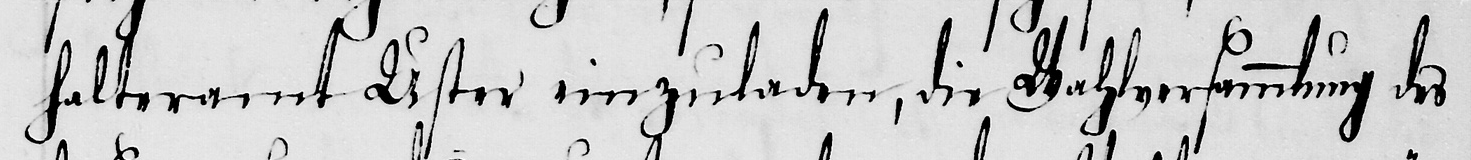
halteramt Uster einzuladen, die Wahlversammlung des
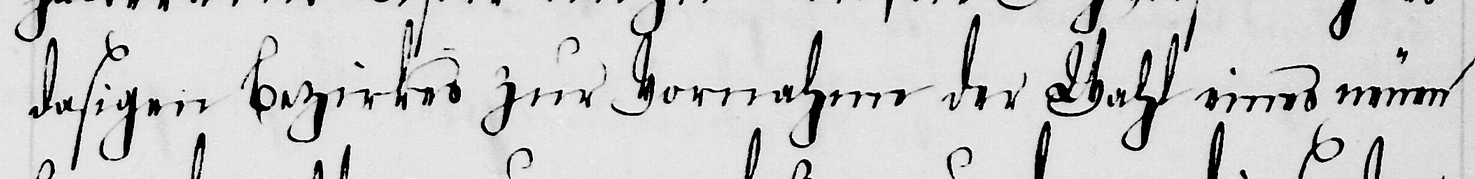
dasigen Bezirkes zur Vornahme der Wahl eines neuen
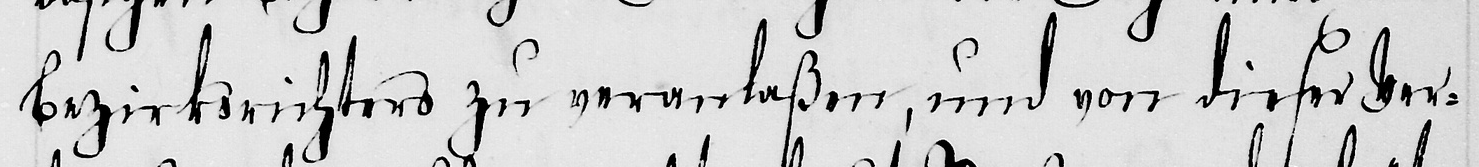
Bezirksrichters zu veranlaßen, und von dieser Ver¬
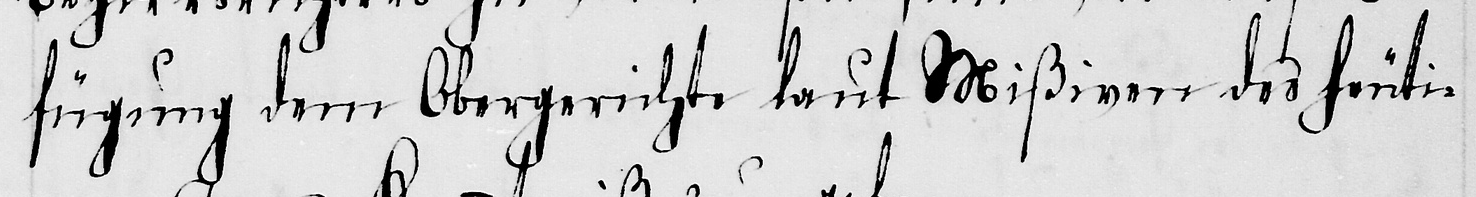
fügung dem Obergerichte laut Mißiven des heuti¬
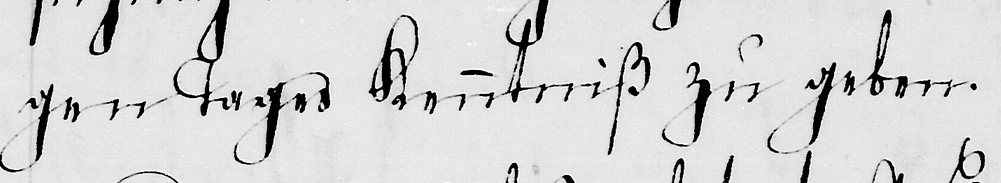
gen Tages Kenntniß zu geben.
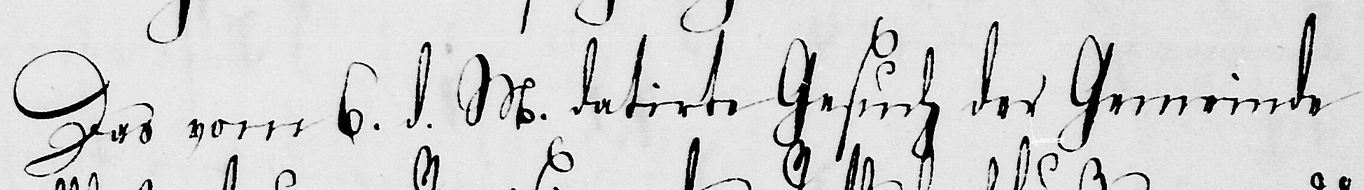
Das vom 6. d. M. datirte Gesuch der Gemeinde
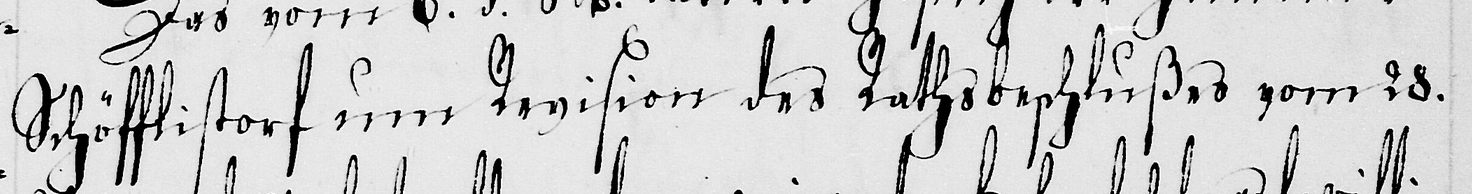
Schöfflistorf um Revision des Rathsbeschlußes vom 28.
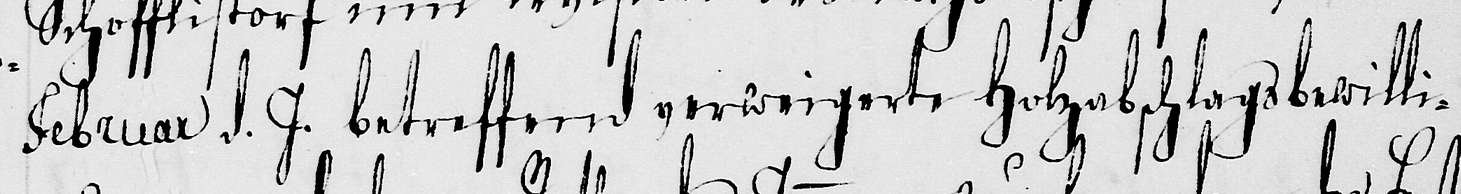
Februar d. J. betreffend verweigerte Holzabschlagsbewill¬
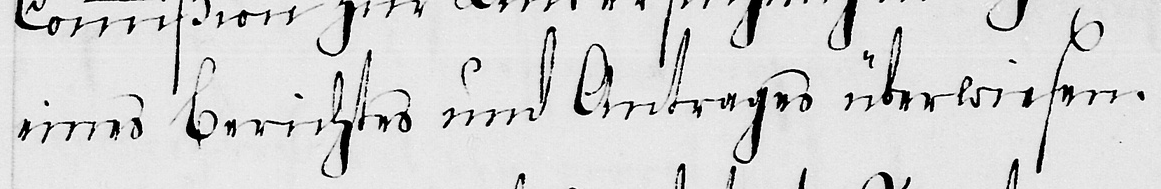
eines Berichtes und Antrages überwiesen.
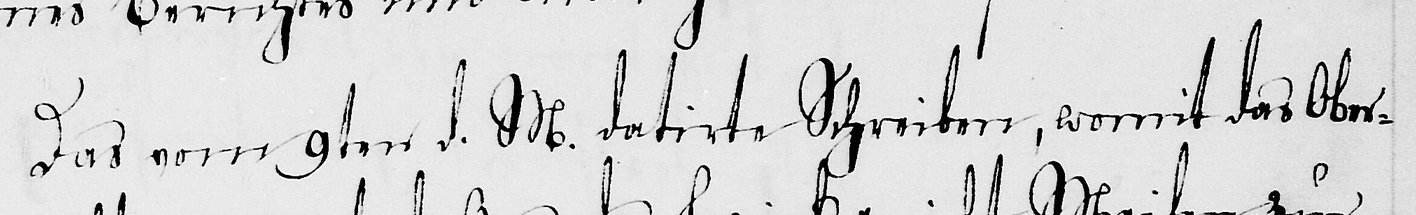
Das vom 9ten d. M .datirte Schreiben, womit das Ober¬
